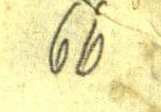66
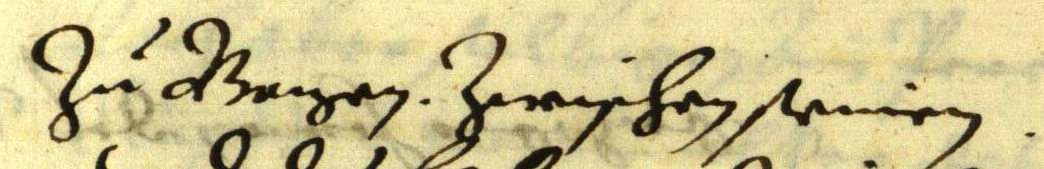Zū Bozen. Zwischen seinen
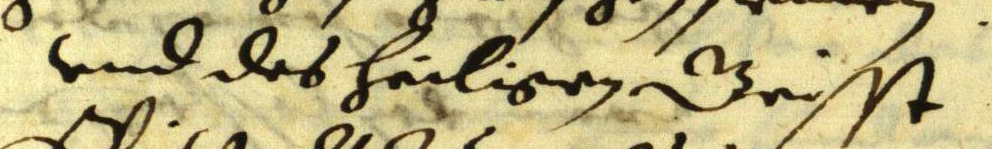vnd des heiligen Geisst
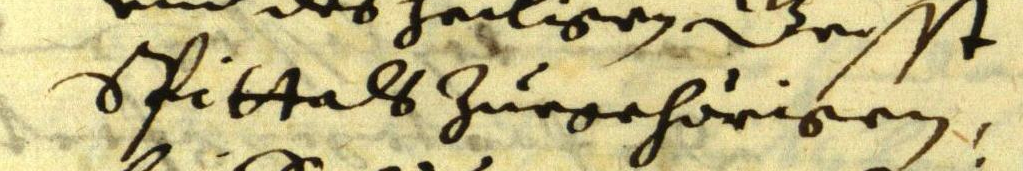Spittals Zūegehōrigen
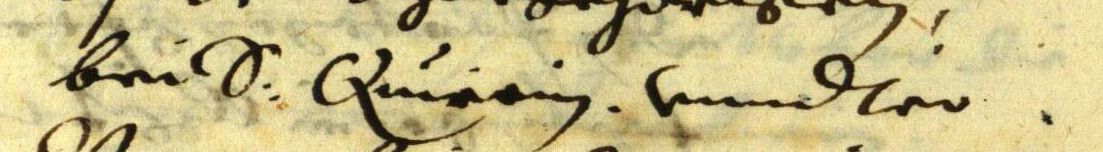bei S: Qūirein. vnndter
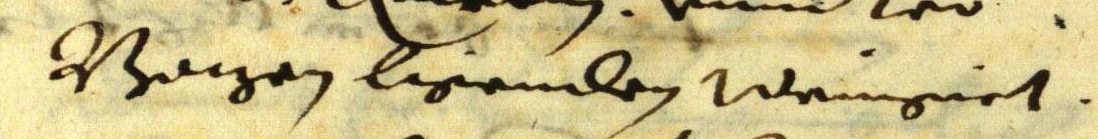Bozen ligenden Weingūet¬
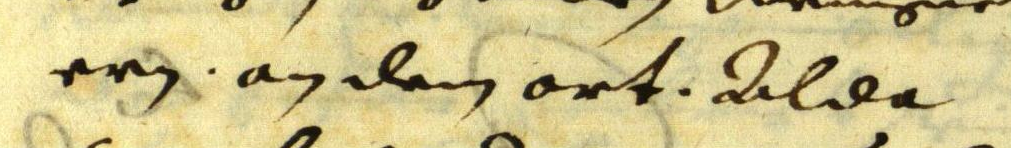ern an den ort. Alda
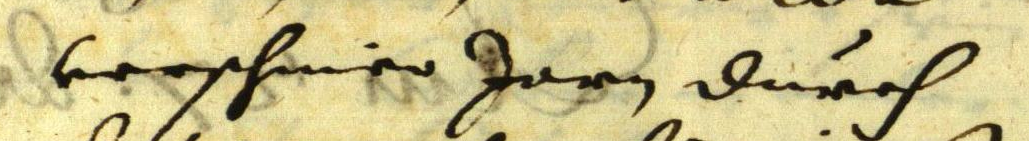verschinen Jarn dūrch
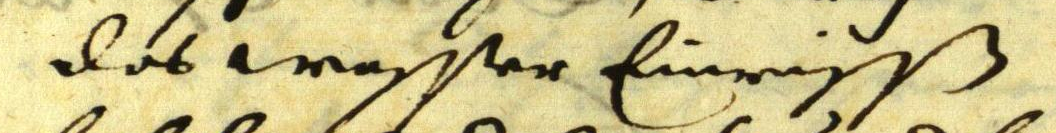das wasser Einrisß
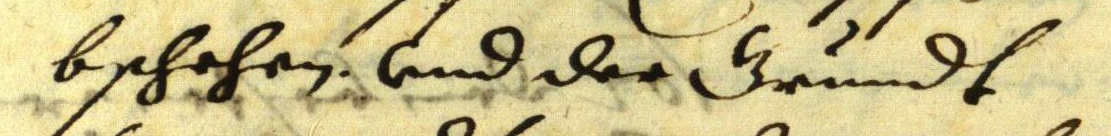bschehen. vnd der Grūnndt
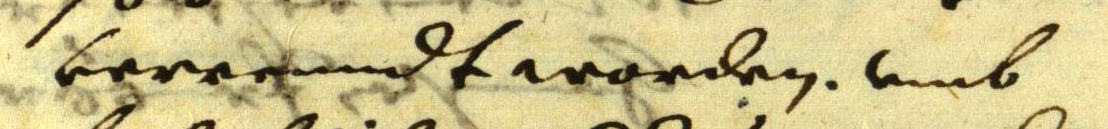verrenndt worden. vmb
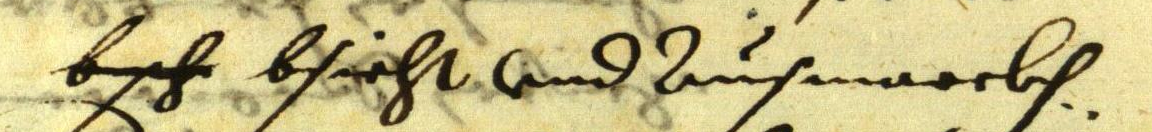bsch bsicht vnd Aūsmarckh¬
